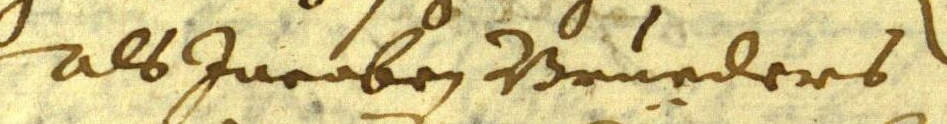Als Jacoben Brūeders
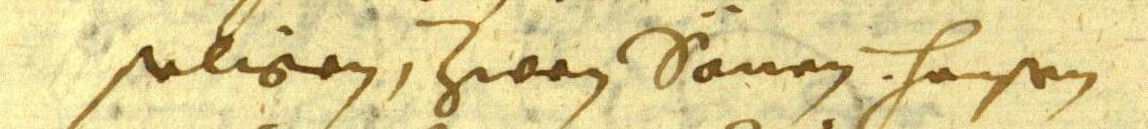seligen, Zwen Sönen. hansen
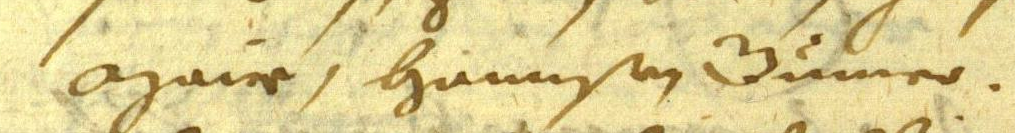Mair, Hannsen Gūmer.
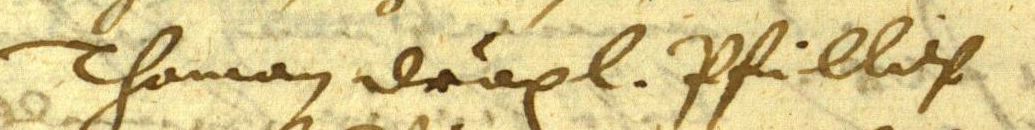Thoman Dräxl. PfilliP
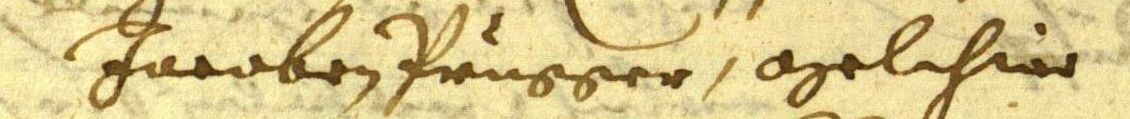Jacoben Prūgger, Melchior
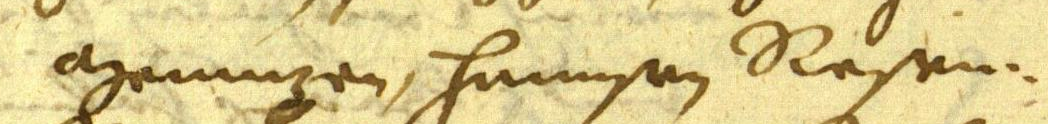Mennzen, hannsen Resen¬
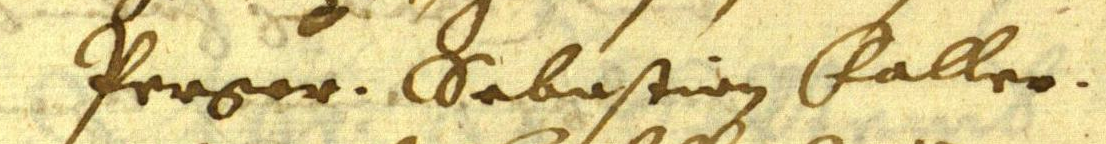Perger. Sebastian Faller.
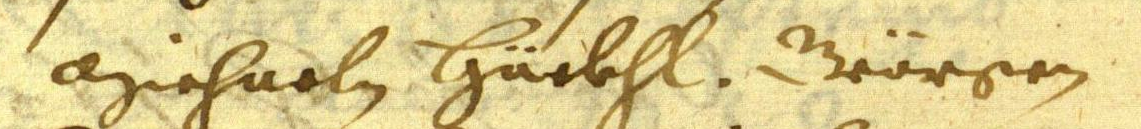Michaeln Häckhl, Geörgen
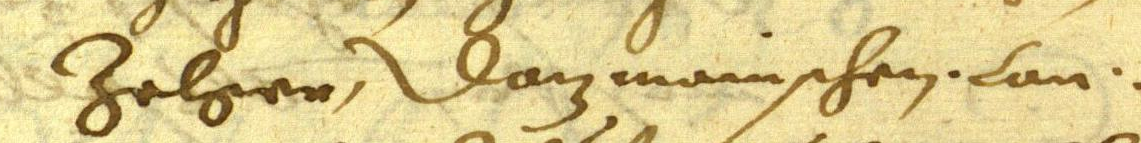Zelger, daz manischen. Con¬
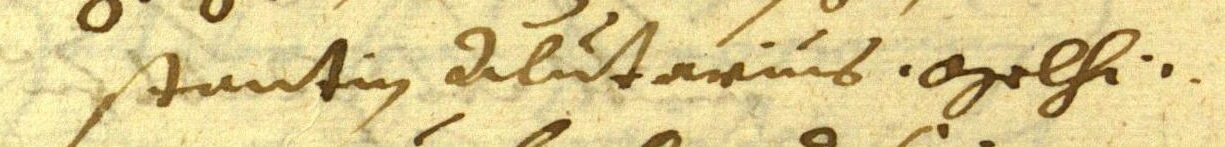stantin Alūtariūs. Melchi¬
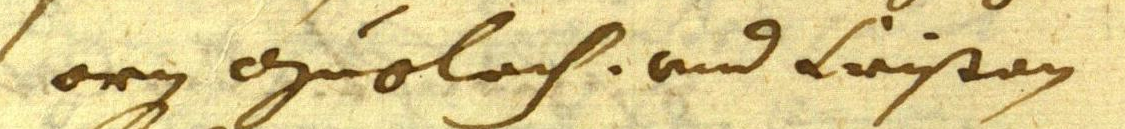orn Mūglach. vnd Cristan
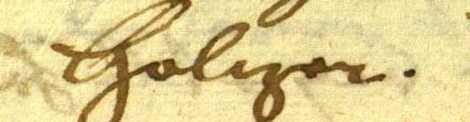Holzer.
